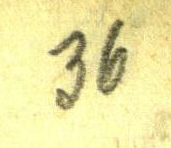36
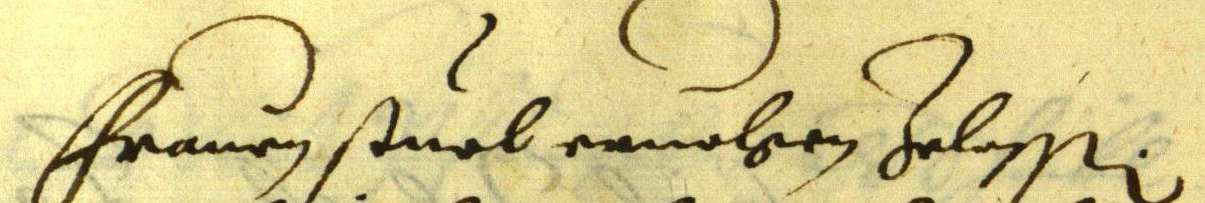Fraūen stūel erūolgen Zelass.
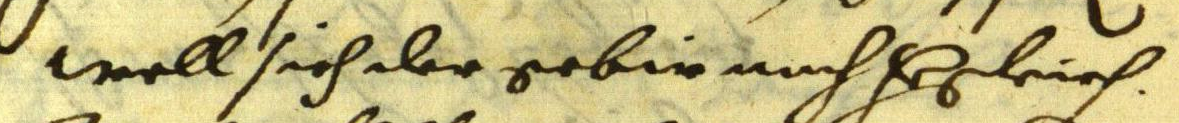well sich der gebir nach vgleich.
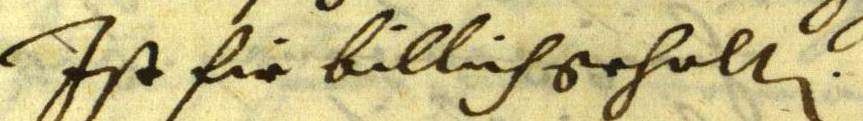Ist fir billich gehalt.
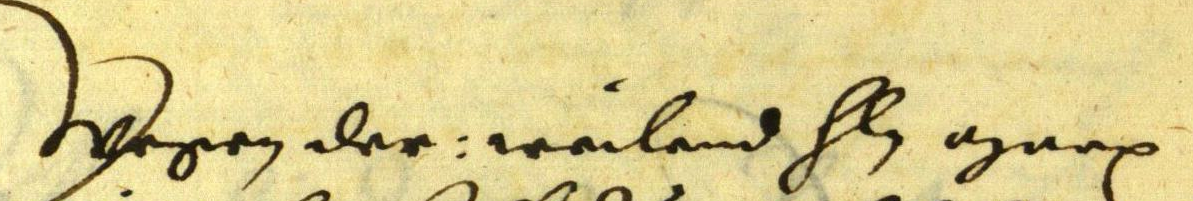Wegen der: weilend hln Marx
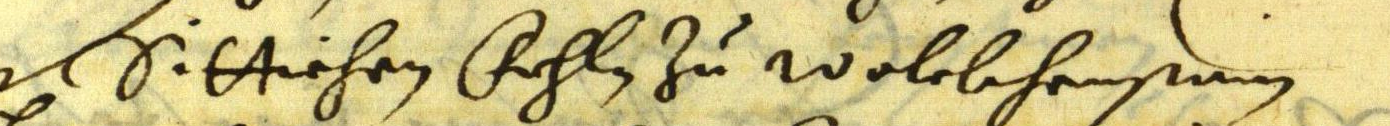Sittichen Frhn Zū Wolckhenstain
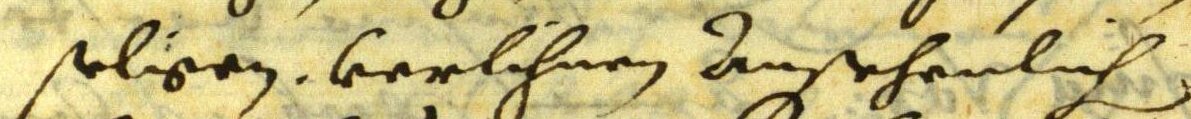seligen. verlihnen Ansehnlich
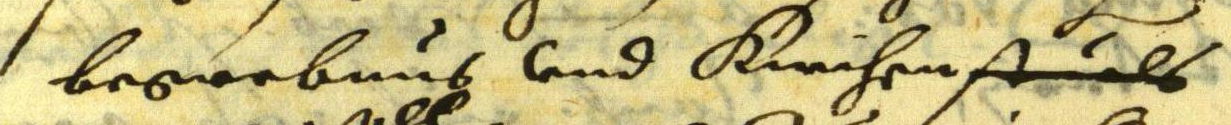begrebūng vnd Kirchenstūels
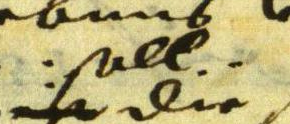:soll:
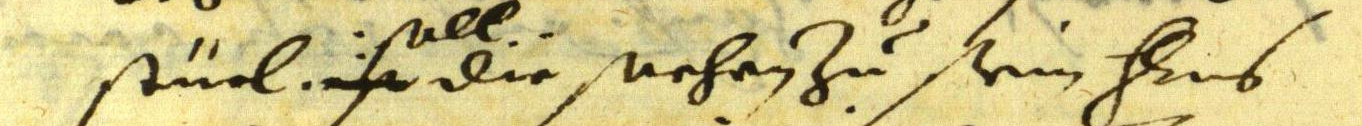stüel ist die sachen Zū sein Haus
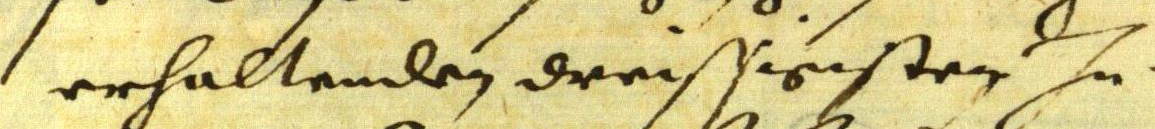erhaltenden dreissigsten In¬
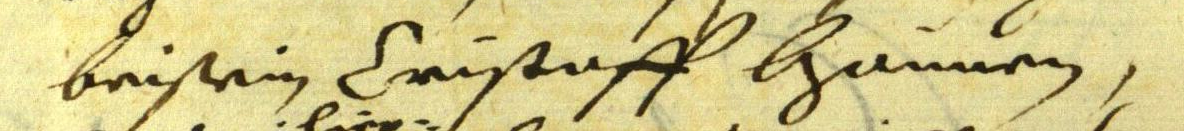beisein Cristoff Haimen,
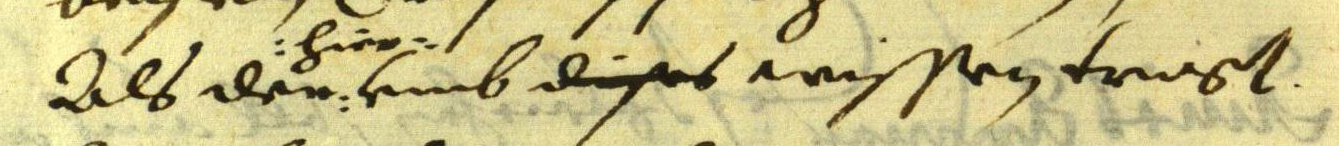Als der hier umb dises wissen tragt
